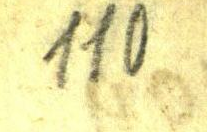110
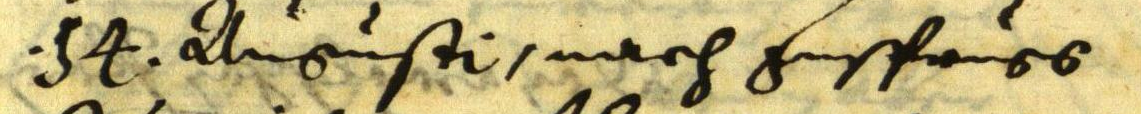.14. Aūgūsti, nach InsPrūgg
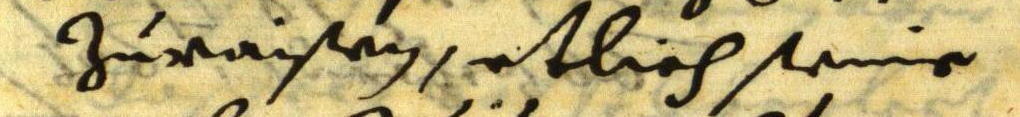Zūraisen, etlich seine
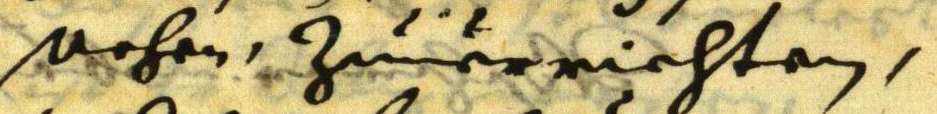sachen, Zūūerrichten,
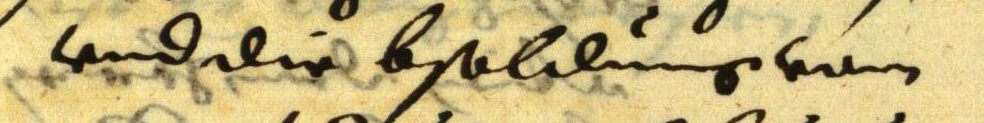vnd die besoldūng vom
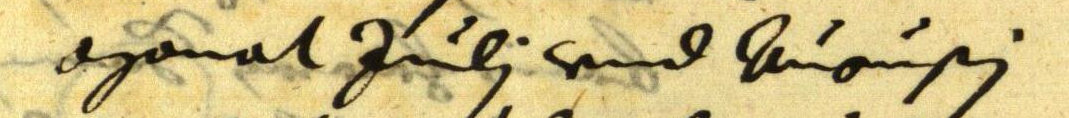Monat Jūlj vnd Aūgūstj
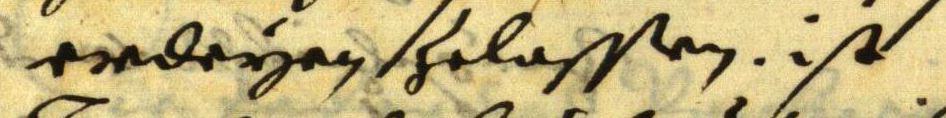erdeȳen Zelassen. ist
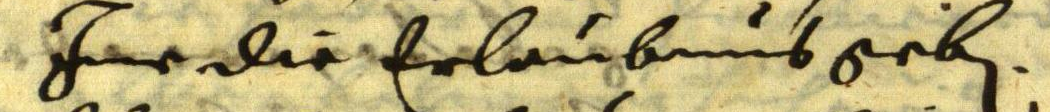Ime die Erlaūbnūs geb.
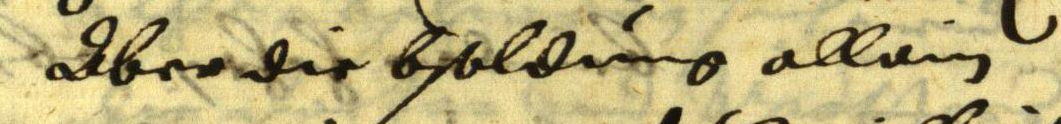Aber die besoldūng allain
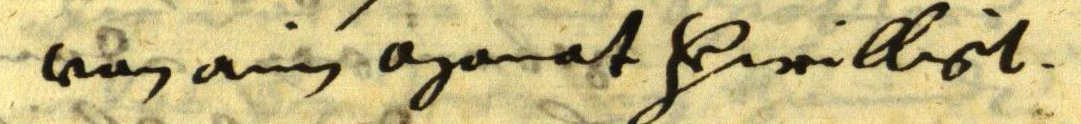von aim Monat vwilligt.
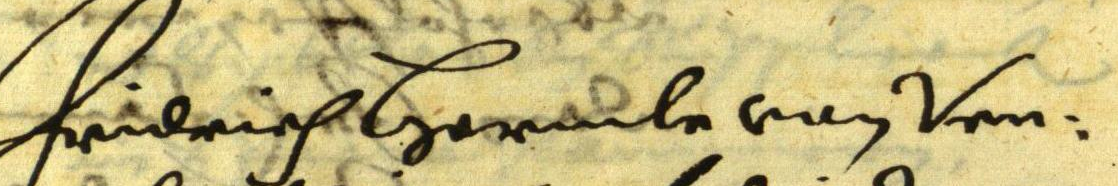Fridrich Hermle von Ven¬
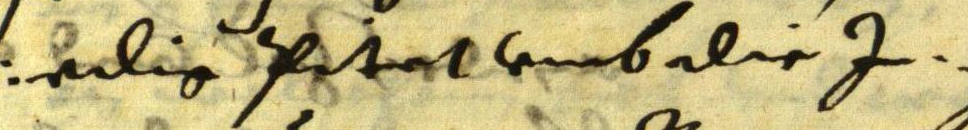edig Pitet vmb die In¬
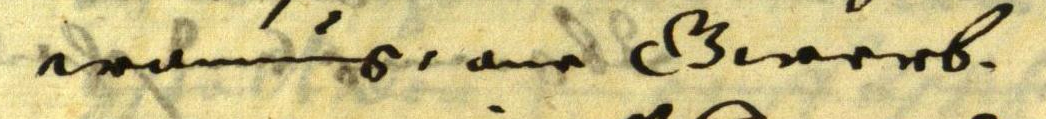wonūng, one Gwerb.
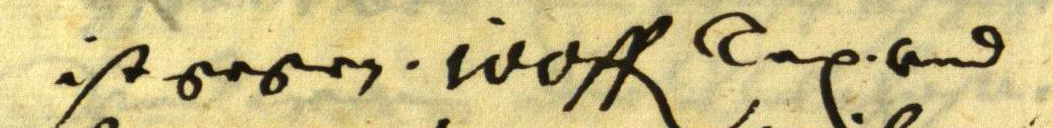ist gegen. 100 fl Tax. vnd
